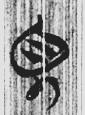○（視）
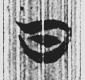日
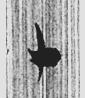十
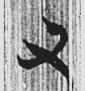又
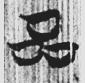厽（三）
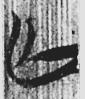亡
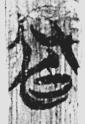○（僕）
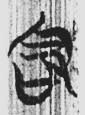命（令）
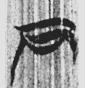尹
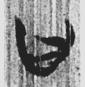曰
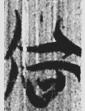尚〈甚〉
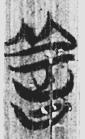善
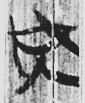𡚦
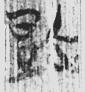{豆攴}
